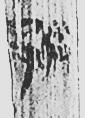{邑𠔉}
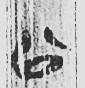公
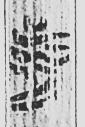涉
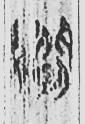{水門夕刀}
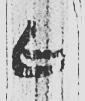㠯（以）
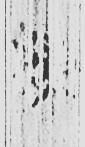{𡴎帚}
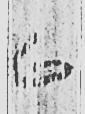㠯（以）
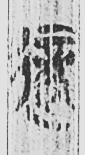復
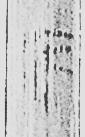長
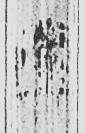陵
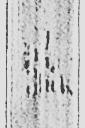之
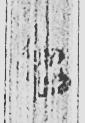𠂤
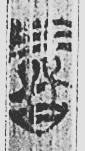{石孖日}
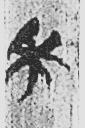年
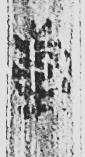倝
